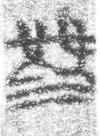淺
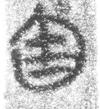缶
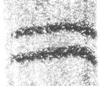二
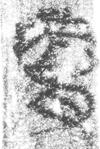膚（爐）
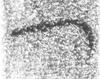一
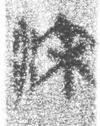浍（沬）
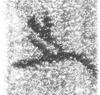之
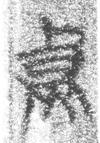鼎
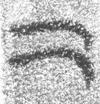二
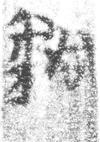○（鈃）
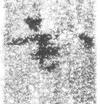屯
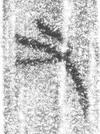又（有）
